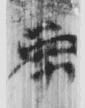不
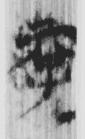{亓子}
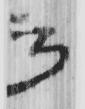乃
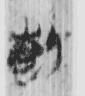{叀刀}
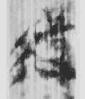迀
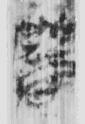{門石}
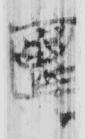匿
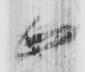㠯（以）
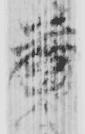{亓子}
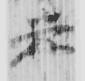亓
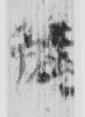{歺者}
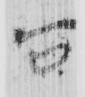古
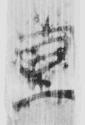疐
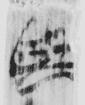爲
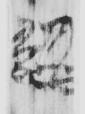溺
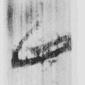㠯（以）
